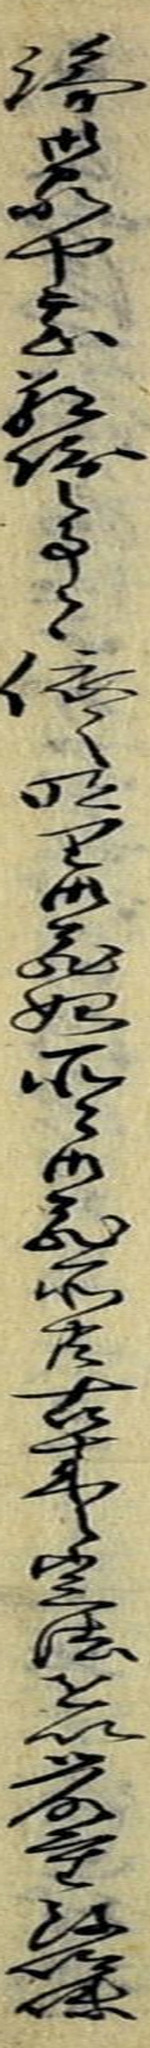論御家中甚難儀之事ニ候依之明里御蔵始所々御蔵所共古来之定法を以厳重致吟味
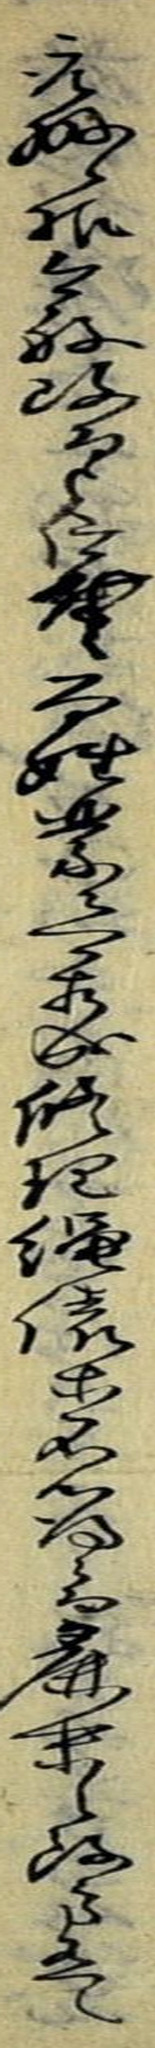取扱候様今般改而被仰付候百姓業ニ可相成修理縄俵等不心得ニ而麁末之致方有之
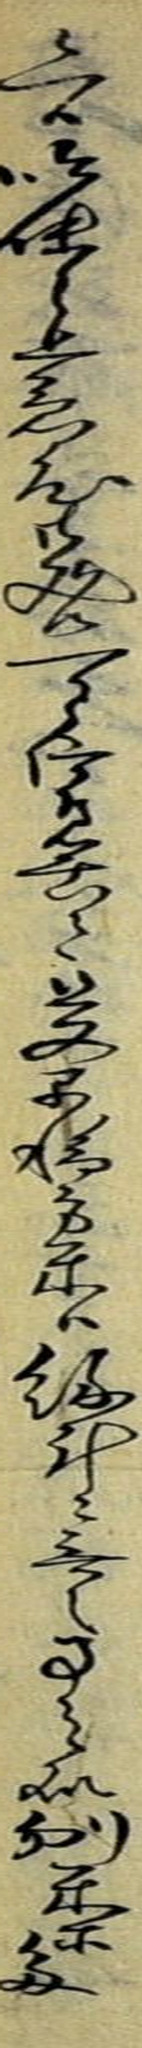候ヘハ吟味之上急度御咎可被仰付筈ニ候且又早稲方米ハ余計ニ無之事ニ候処憤刎米等多
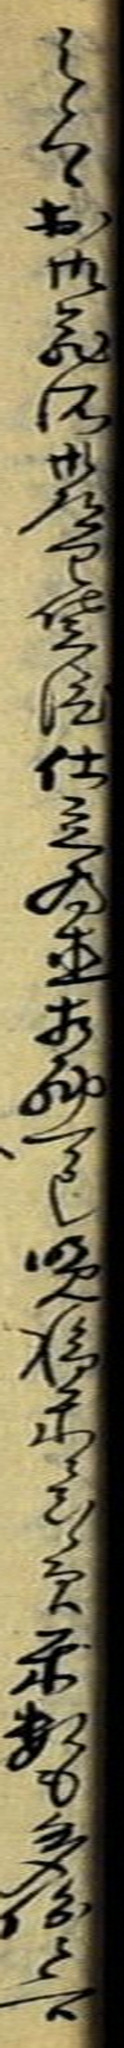之候ハヽ於御蔵所御道具貸渡仕立為直相納可申候晩稲米ニ至候而ハ米数も多儀ニ候ヘハ
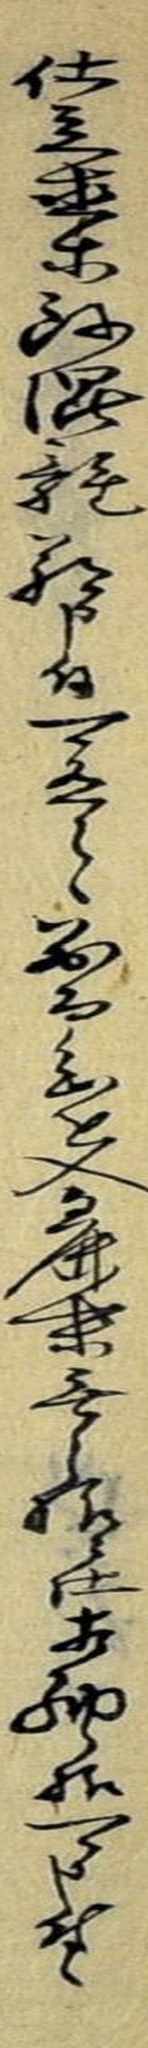仕立直等致混雑難申付可有之候別而念を入麁末無之様ニ仕相納候様可申付候
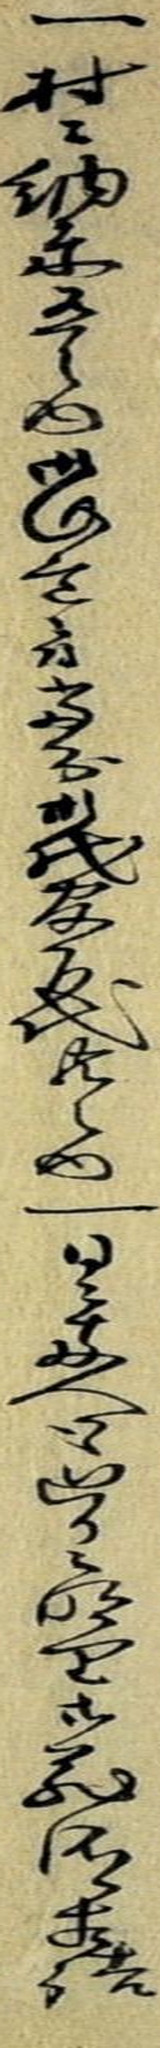一村々納米有之内御趣意ニ付当分御代官下代共之内一日ニ両人ツヽ廻りニ明里御蔵所へ相詰
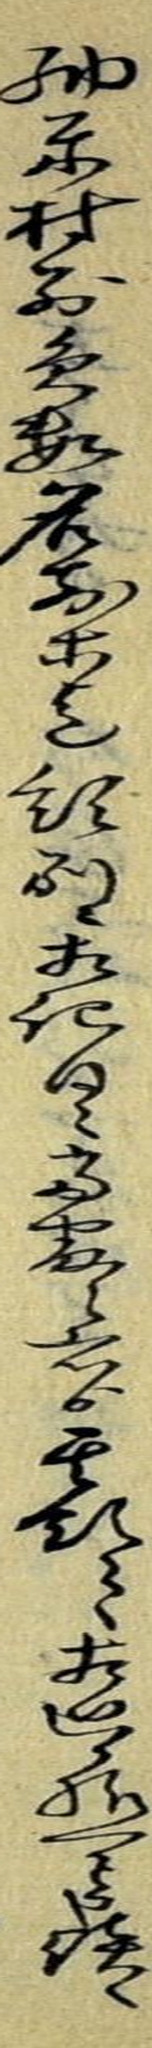納米村別員数名前等迄領別ニ相記日々当番之者ゟ其領々へ相廻候様可被申談候
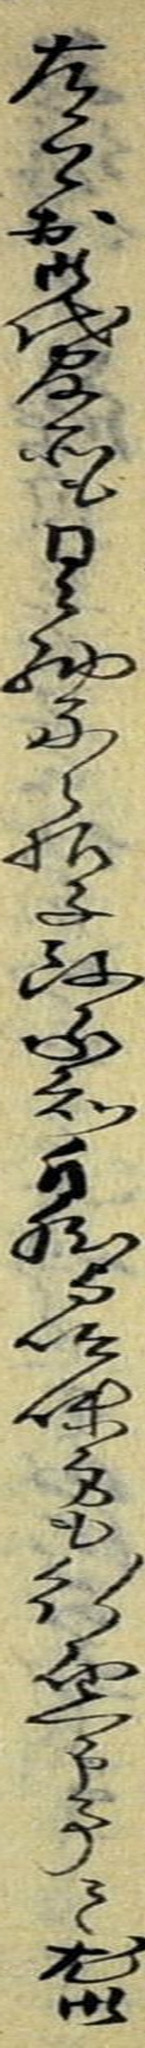左候ハヽ於御代官所も日々納米之様子致承知自然与吟味方も行届可申事ニ候尤御
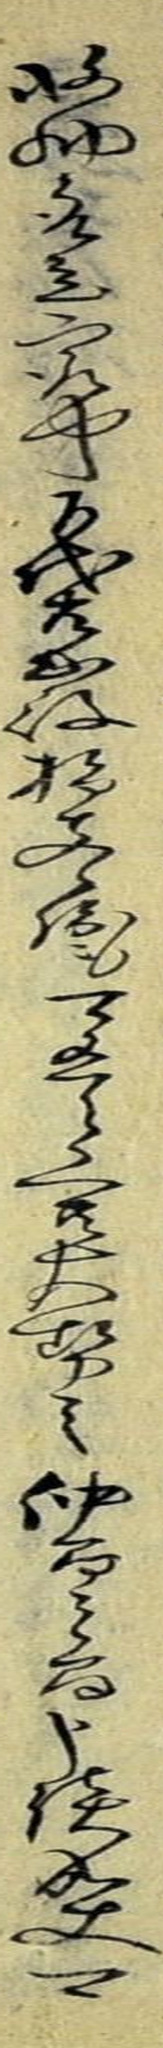収納取立最中下代共出役指支候儀も可有之候へ共大勢之仲間ニ候間申談成丈可
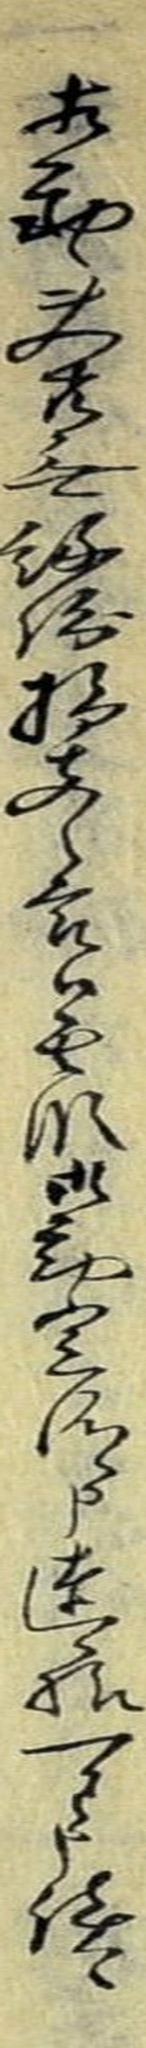相勤候夫共無余儀指支候節ハ其段御勘定所へ申達候様可被申談候
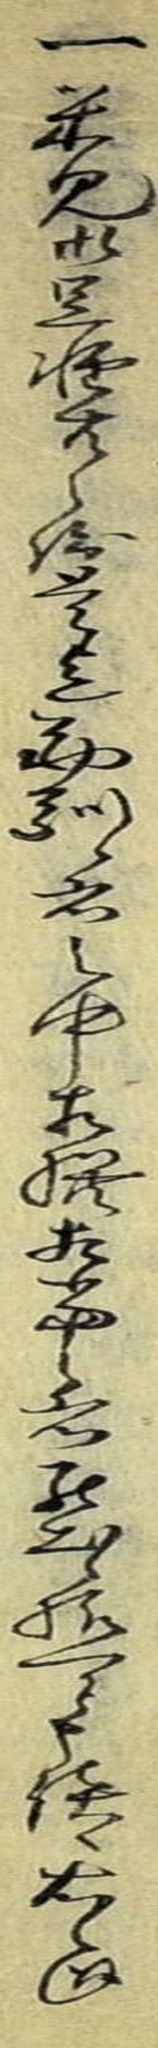一米見御足軽共之儀是迄勤馴候者之中相担相当之者罷出候様可被申談候右之趣
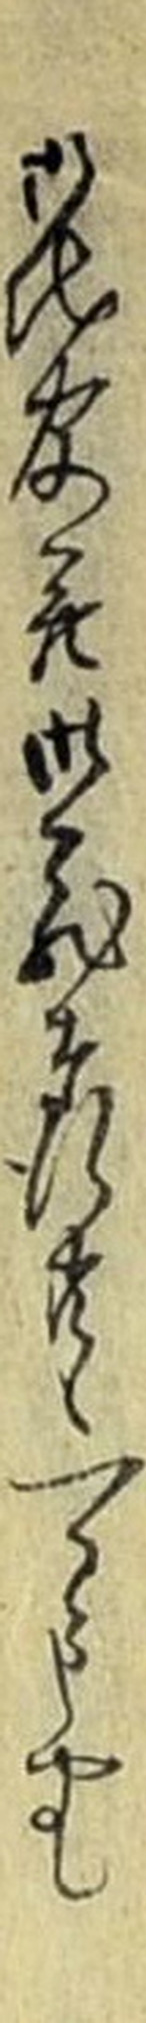御代官并御蔵奉行共へ可被申聞候
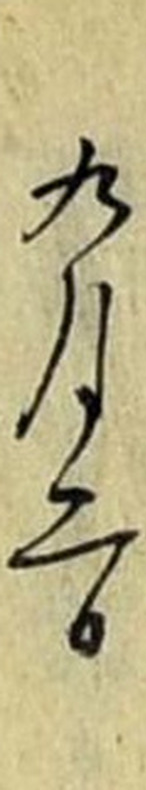九月二日
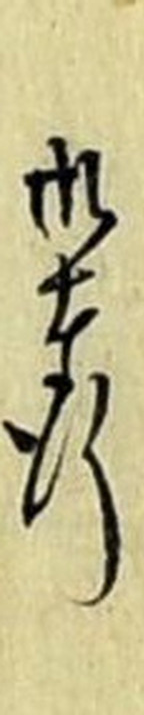御奉行
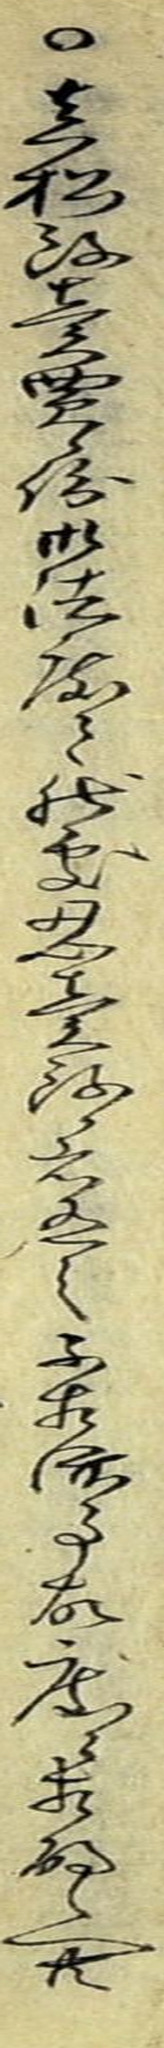〇真松致売買候儀御法度ニ候然処忍売致候者有之不相済事故度々相触候へ共
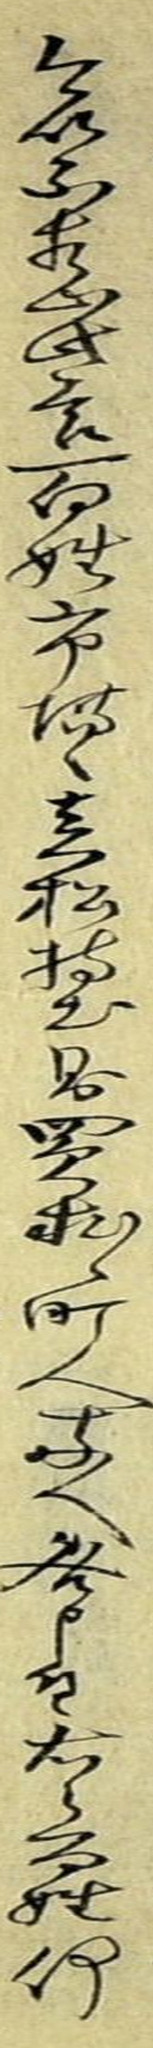今以不相止此節百姓市場へ真松持出則買求候町人両人咎申付候右之百姓何
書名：命令之部 三
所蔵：福井県文書館 Fukui Prefectural Archives
